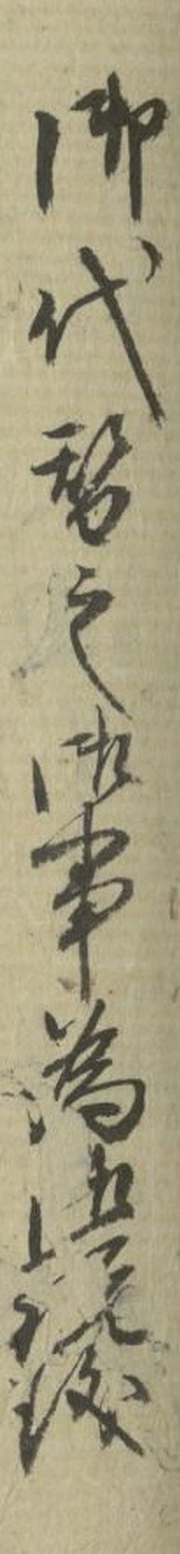御代替之御事為御祝儀
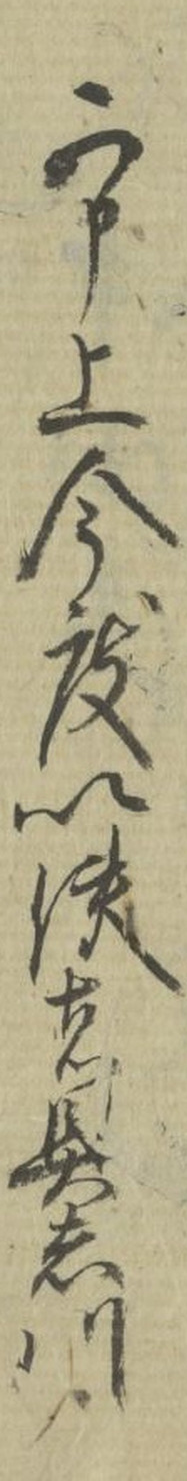可申上今度以使者具志川
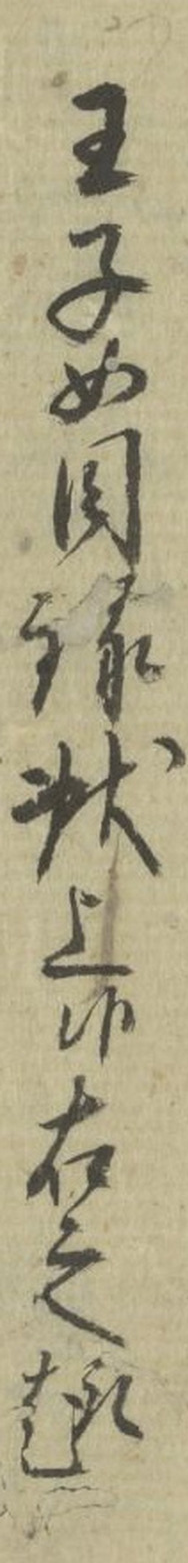王子如目録献上候右之趣
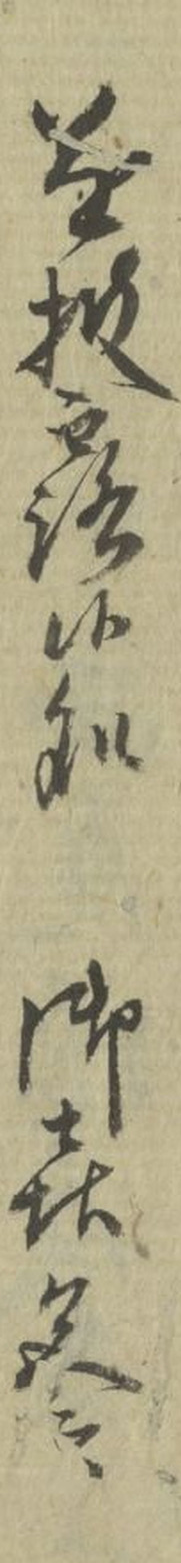遣披露候処御喜色之
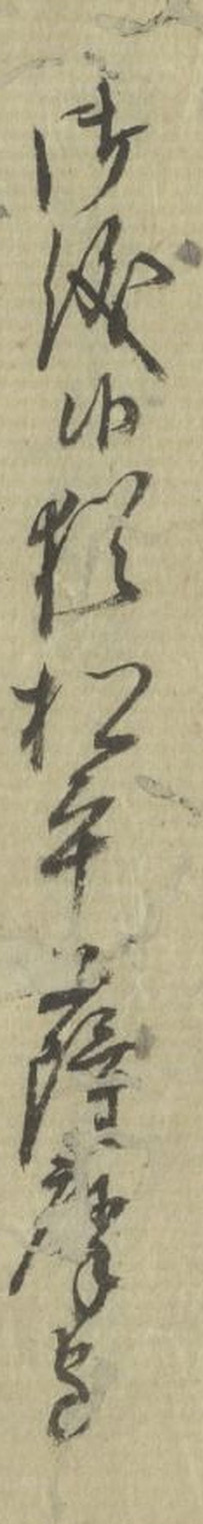御儀候猶松平薩摩守

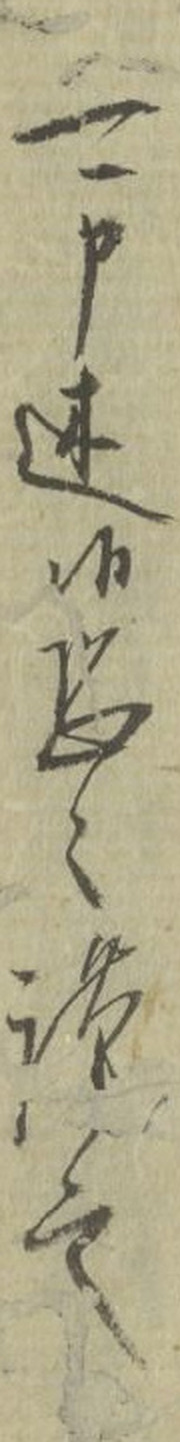可申述候恐々謹言
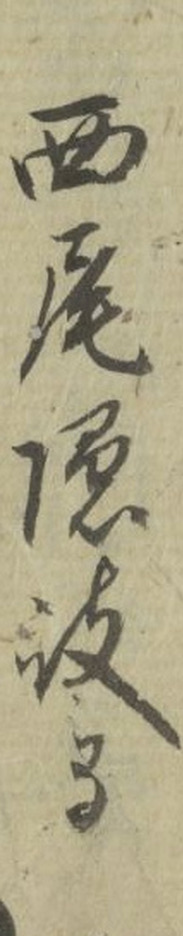西尾隠岐守
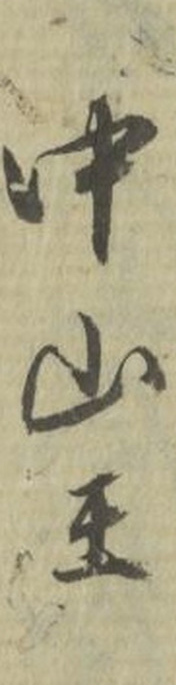中山王
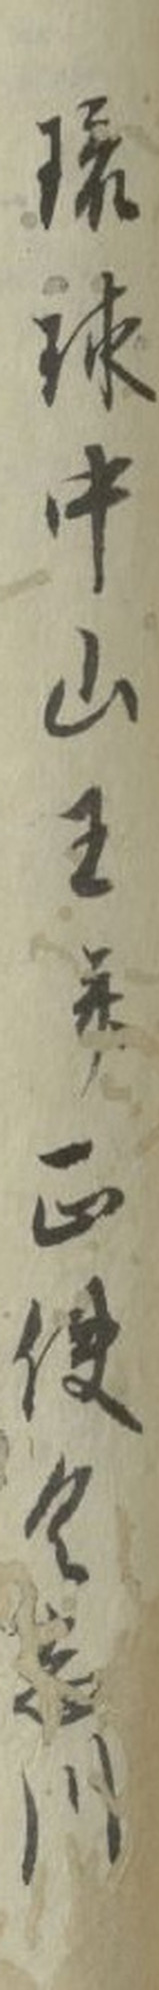琉球中山王幷正使具志川
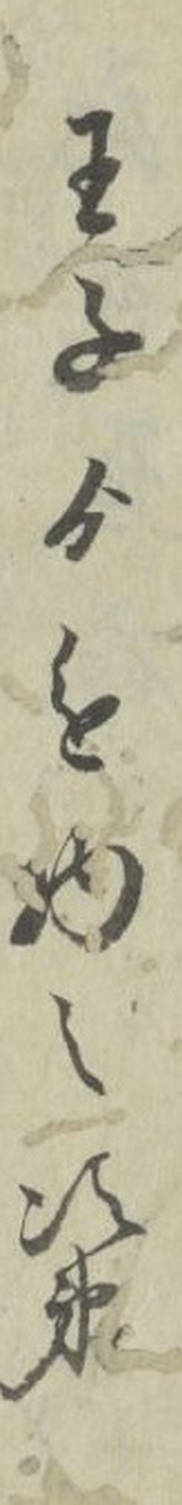王子ゟ進物之次第
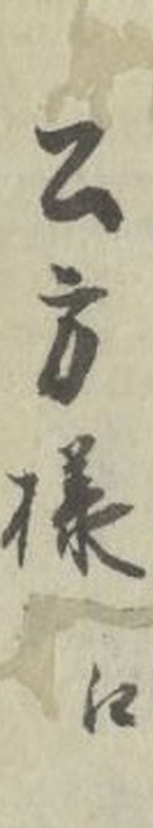公方様え
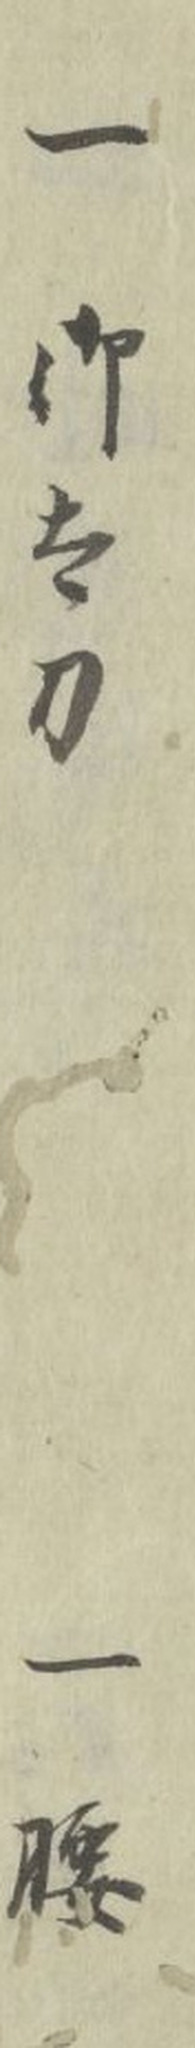一御太刀一腰
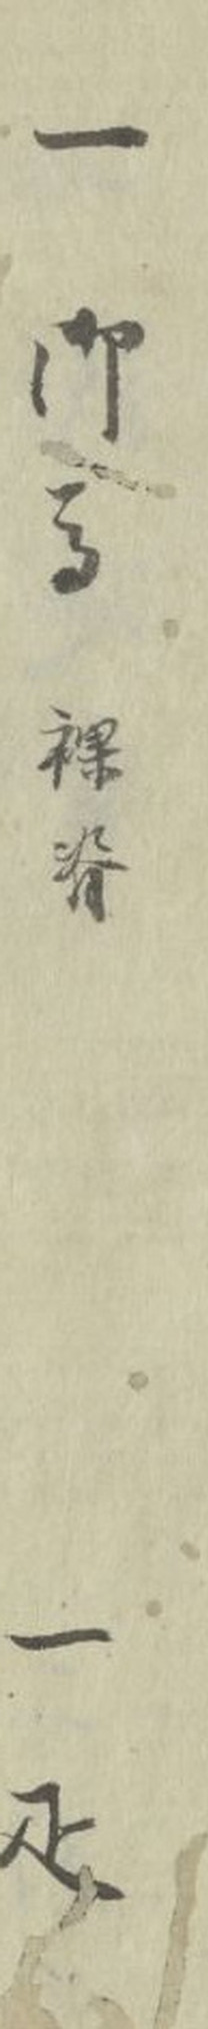一御馬裸背一疋
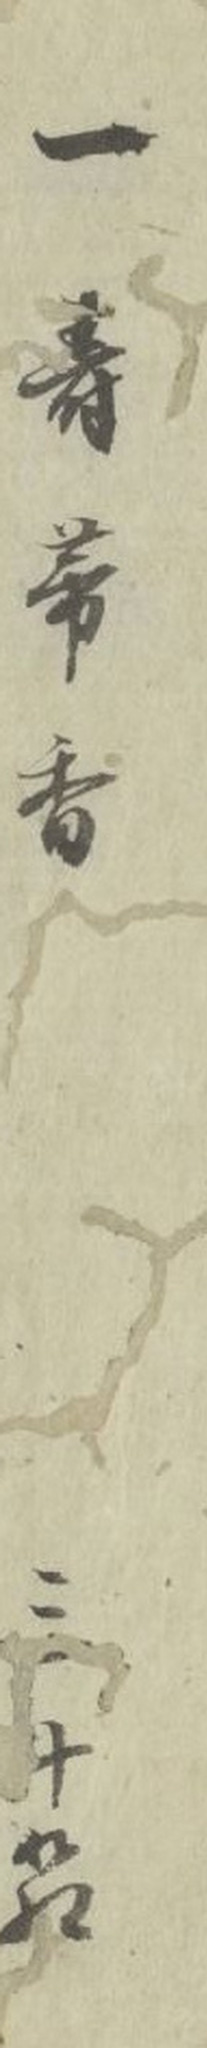一寿帯香三十箱

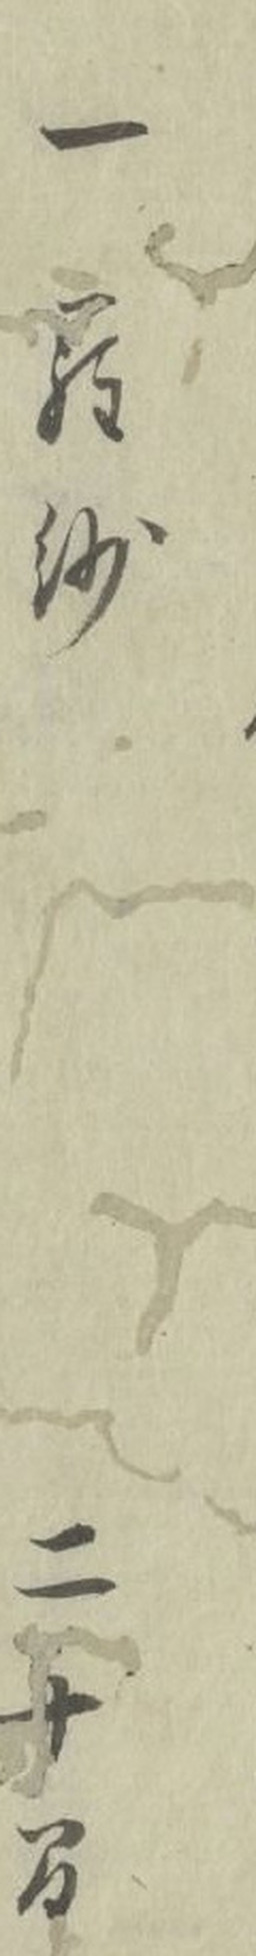一羅沙二十間

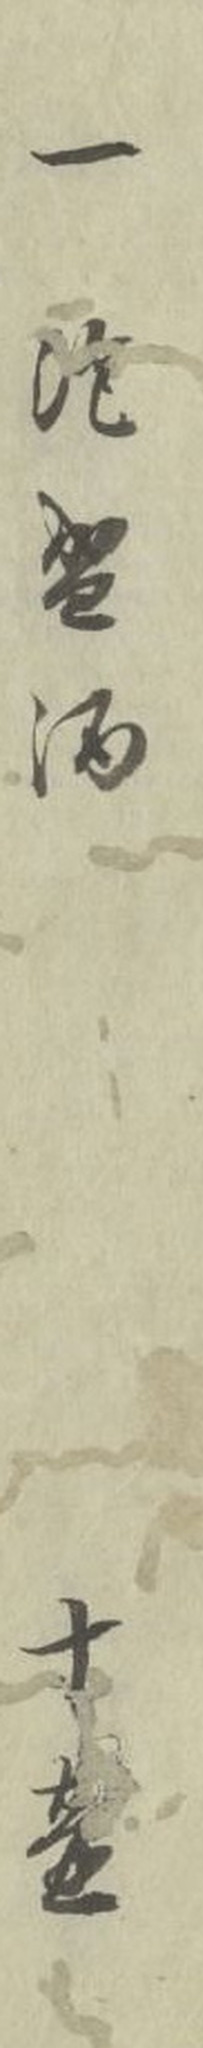一泡盛酒十壺
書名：琉球来朝記 自八至十四終
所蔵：University of the Ryukyus Library
